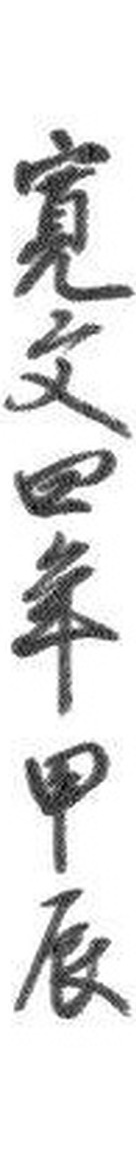寛文四年申辰
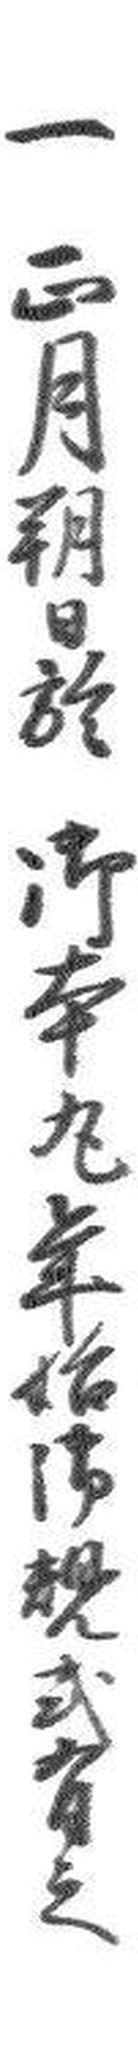一正月朔日於御本丸年始御規式有之
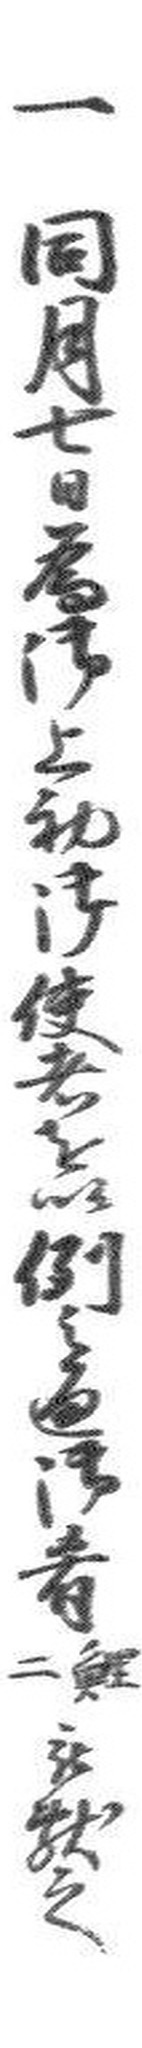一同月七日為御上初御使者を以例之通御肴鯉二被献之
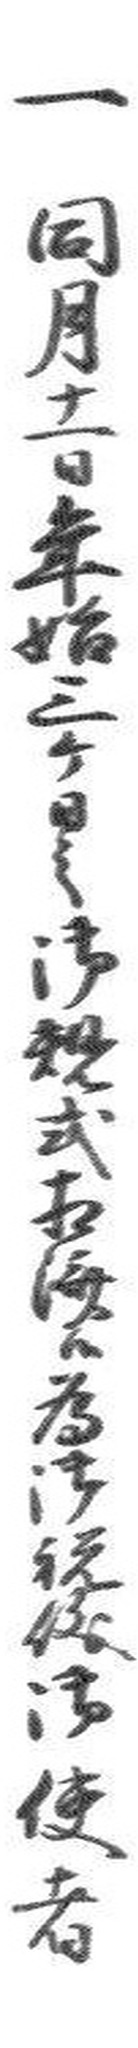一同月十一日年始三ケ日之御規式相済候為御祝儀御使者
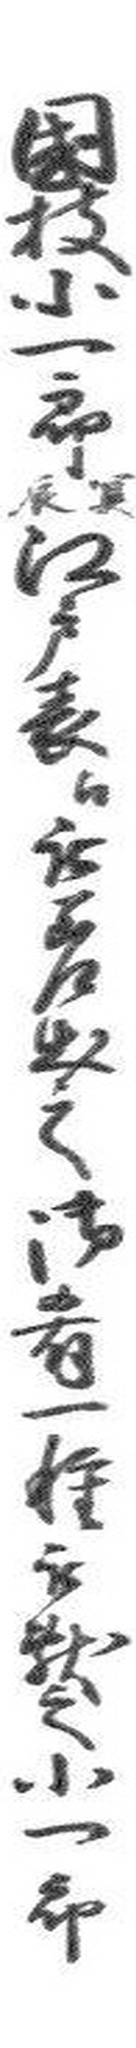国枝小一郎辰江戸表江被差出之御肴一種被献之小一郎
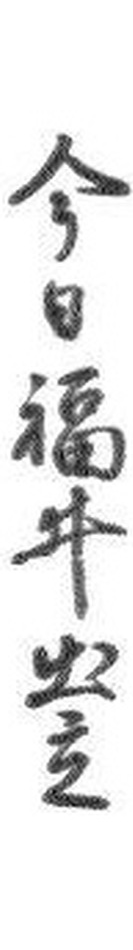今日福井出立
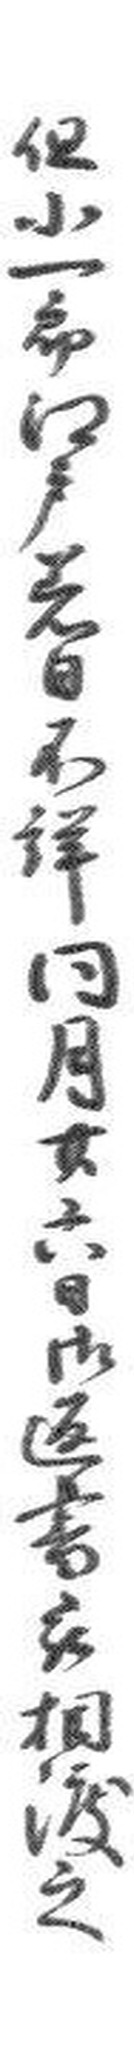但小一郎江戸着不詳同月廿六日御返書被渡之

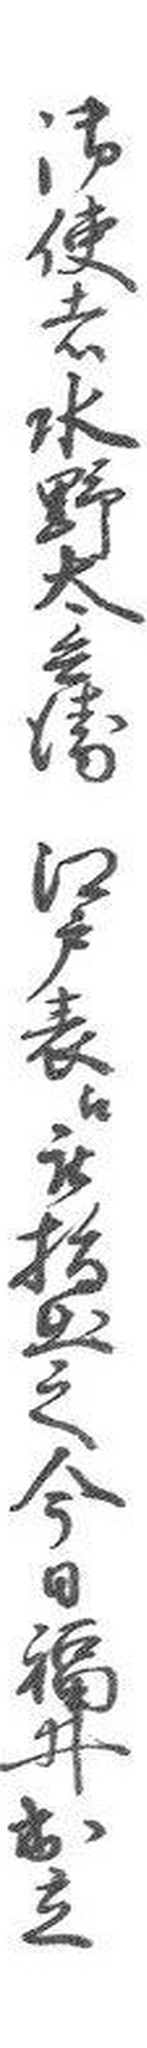御使者水野太兵衛江戸表江指出之今日福井出立
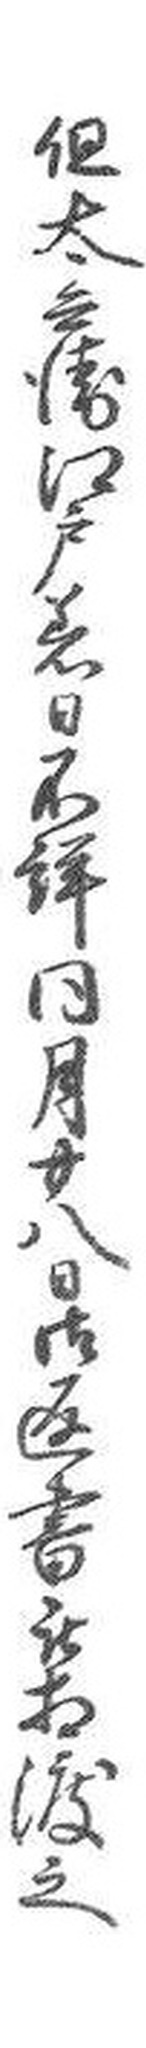但太兵衛江戸着日不詳同月廿八日御返書日相渡之
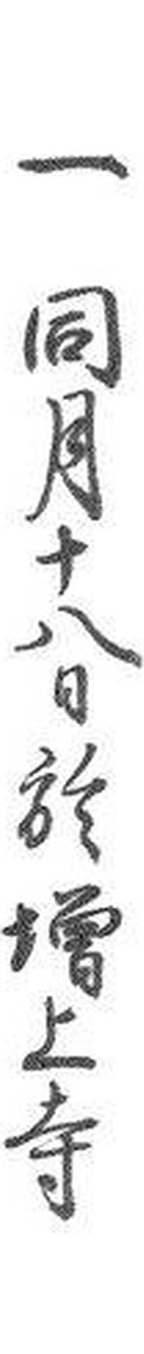一同月十八日於増上寺
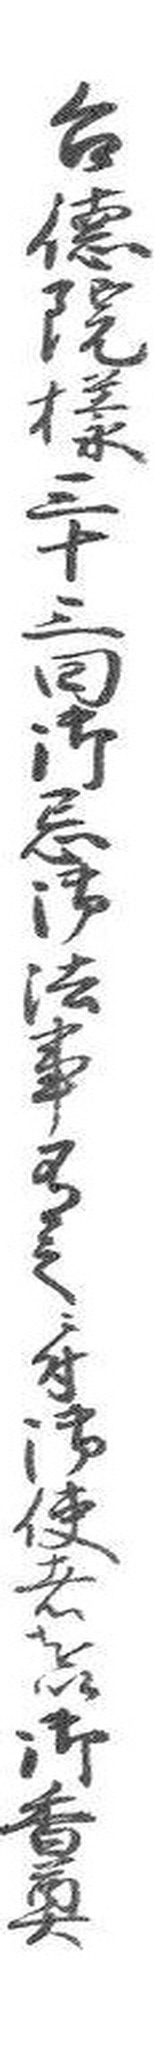台徳院様三十三回御忌御法事有之ニ付御使者を以御香典
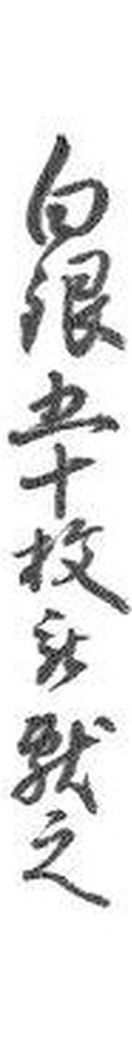白銀五十枚被献之
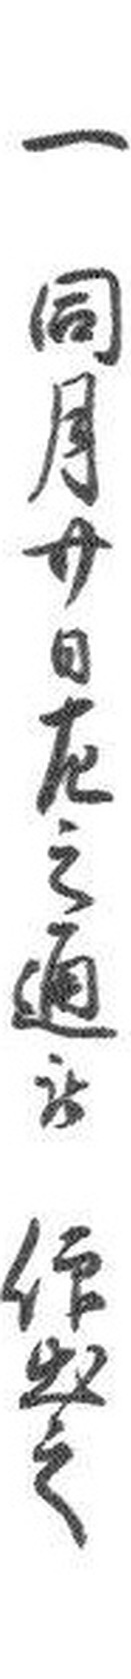一同月廿日左之通被仰出之
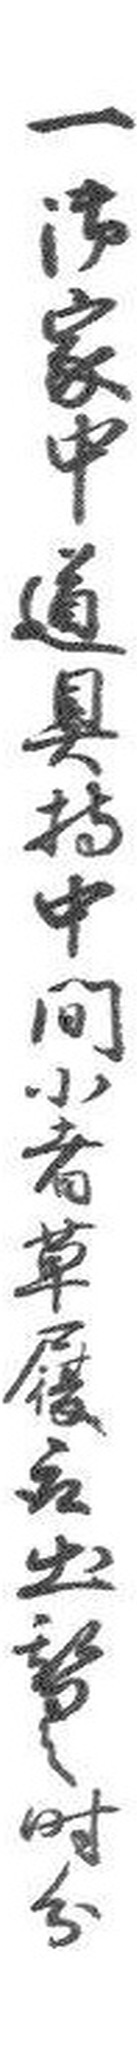一御家中道具持中間小者草履取出替之時分
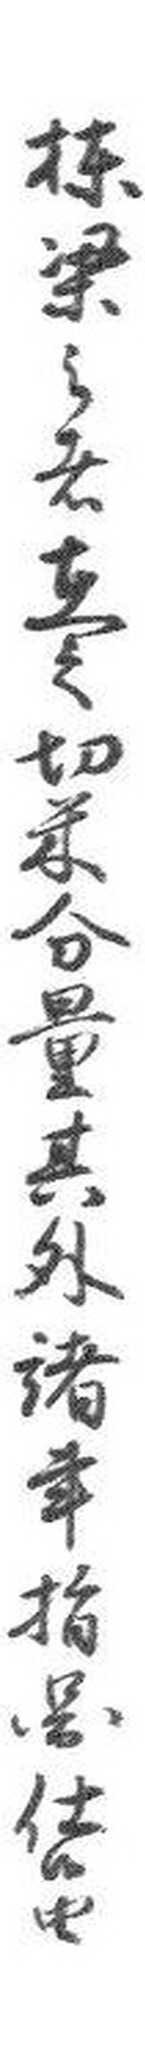棟梁之者在之切米分量其外諸事指図仕候由
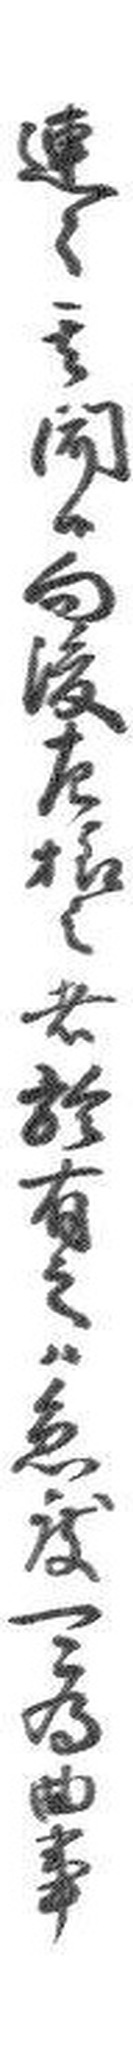連々其聞候向後左様之者於有之ㇵ急度可為曲事
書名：家譜 七 光通公 従寛文四年到同九年
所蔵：福井県文書館 Fukui Prefectural Archives
